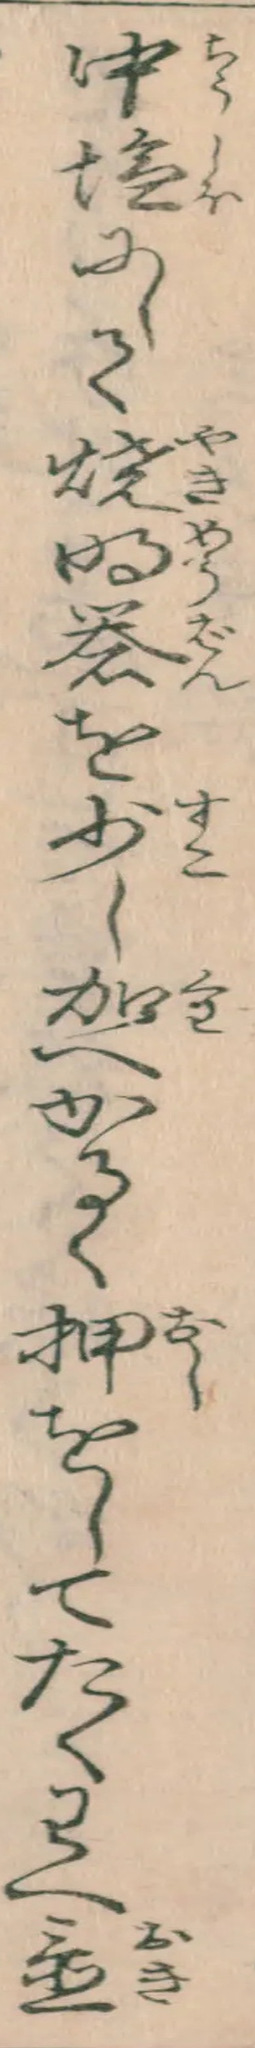中塩にて焼明礬を少し加へかるく押をしてたくわへ置
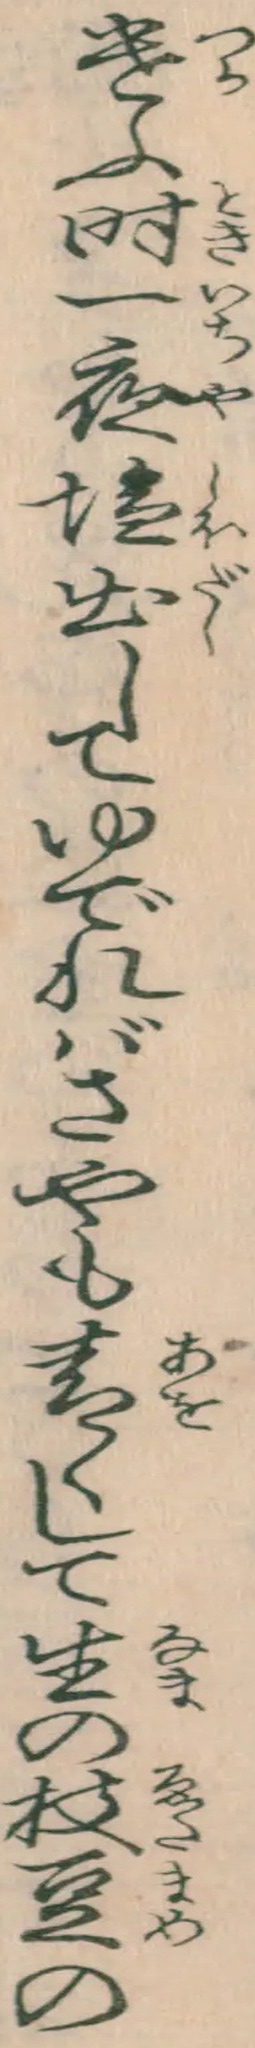遣ふ時一夜塩出してゆでればさやも青くして生の枝豆の
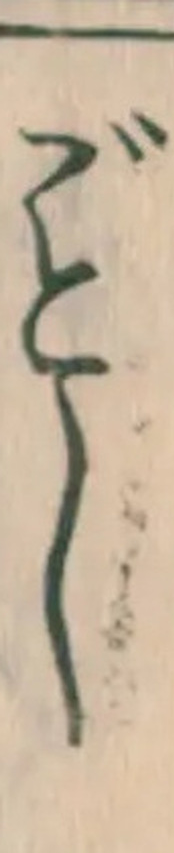ごとし
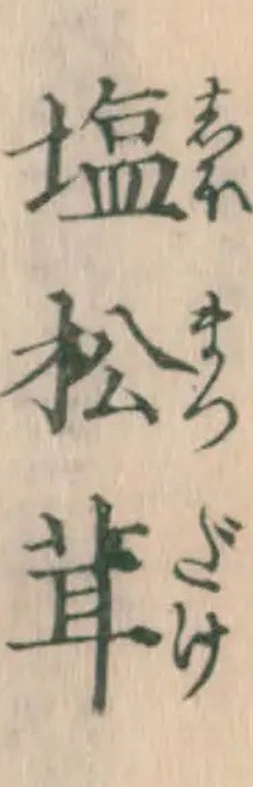塩松茸
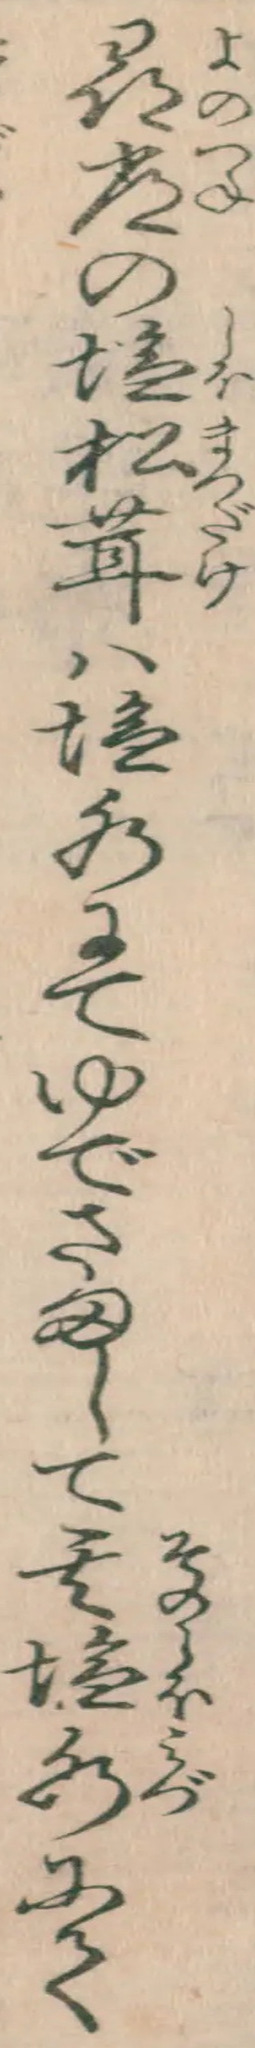尋常の塩松茸は塩水にてゆでさまして其塩水にて
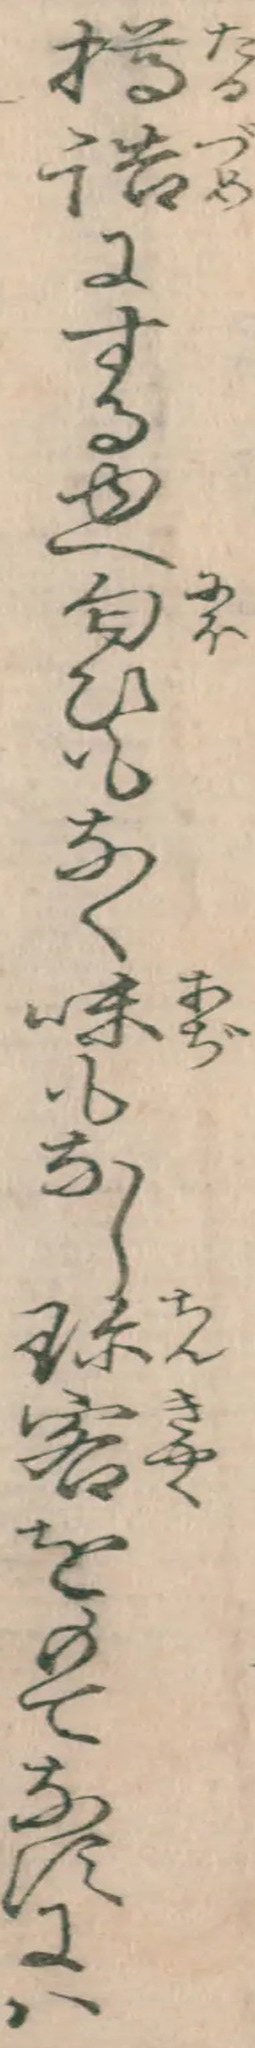樽詰にするゆへ匂ひもなく味もなし珍客をもてなすには
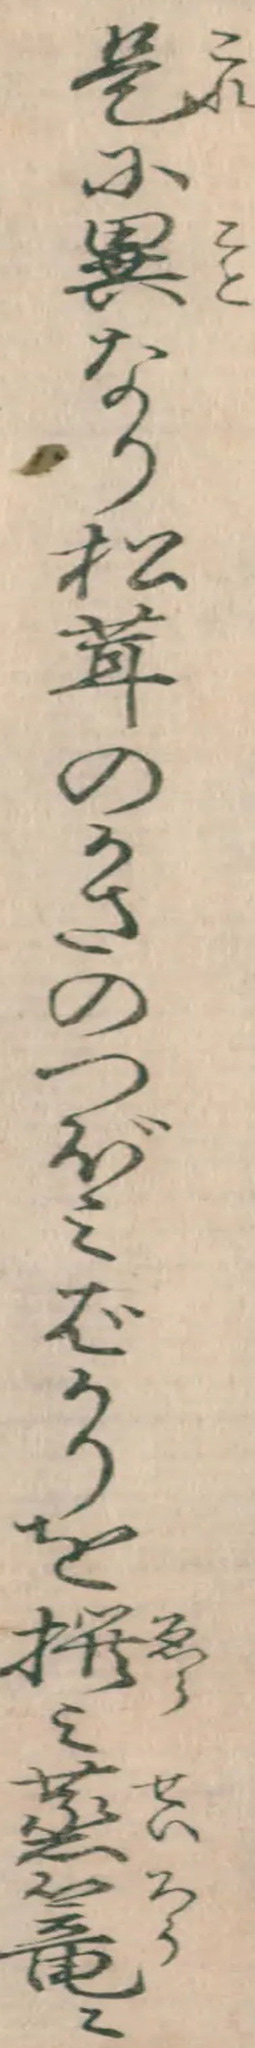是に異なり松茸のかさのつぼみばかりを撰み蒸籠に
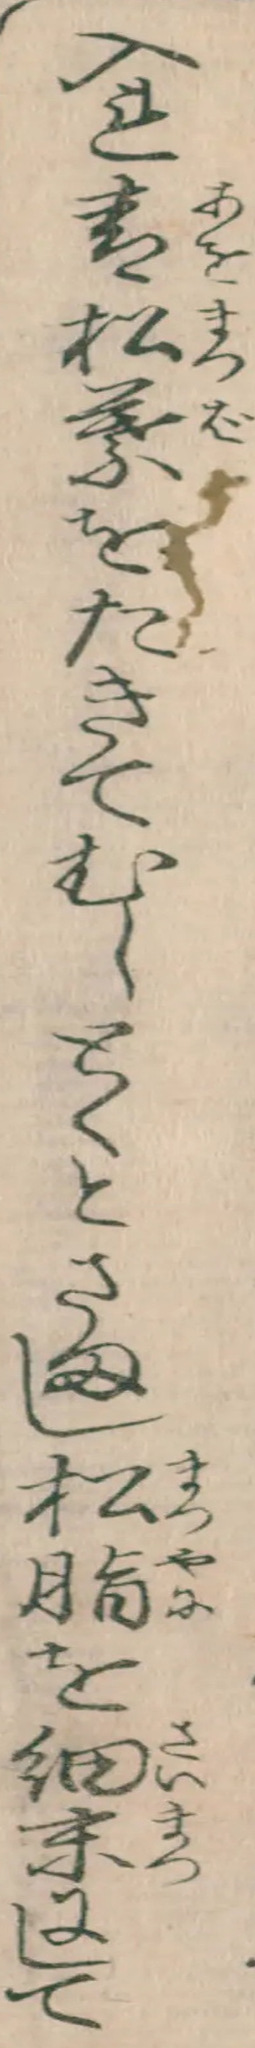入れ青松葉をたきてむしとくとさまし松脂を細末にして

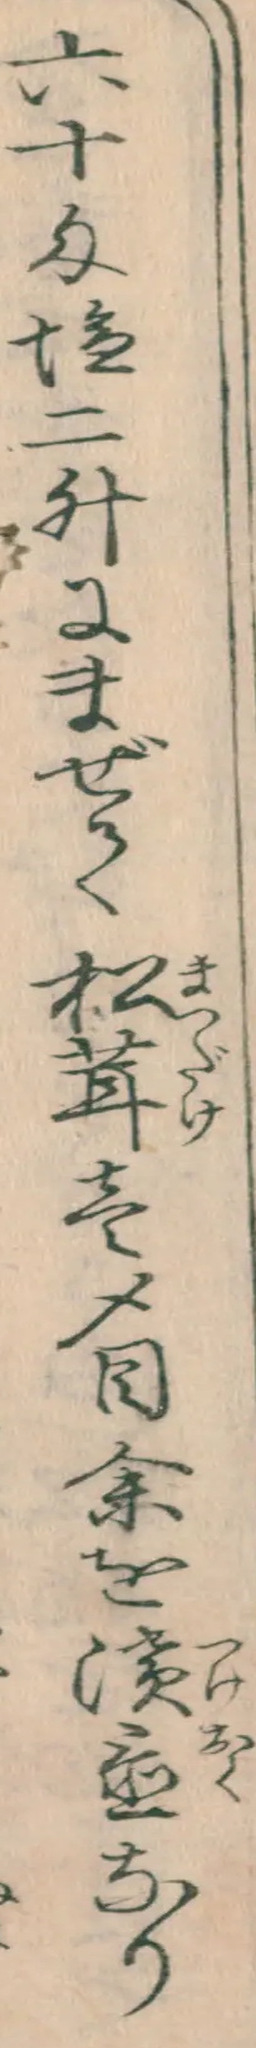六十匁塩二升にまぜて松茸壱〆目余を漬置なり
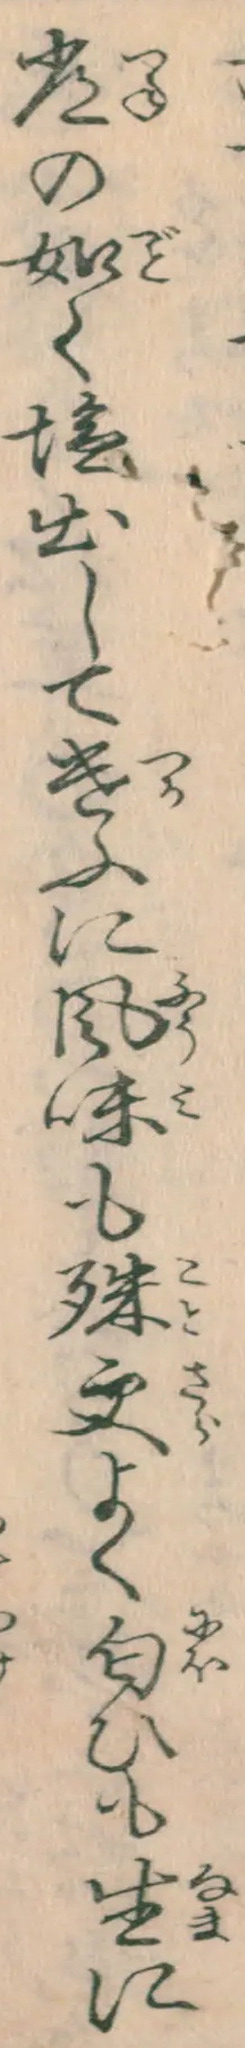常の如く塩出して遣ふに風味も殊更よく匂ひも生に
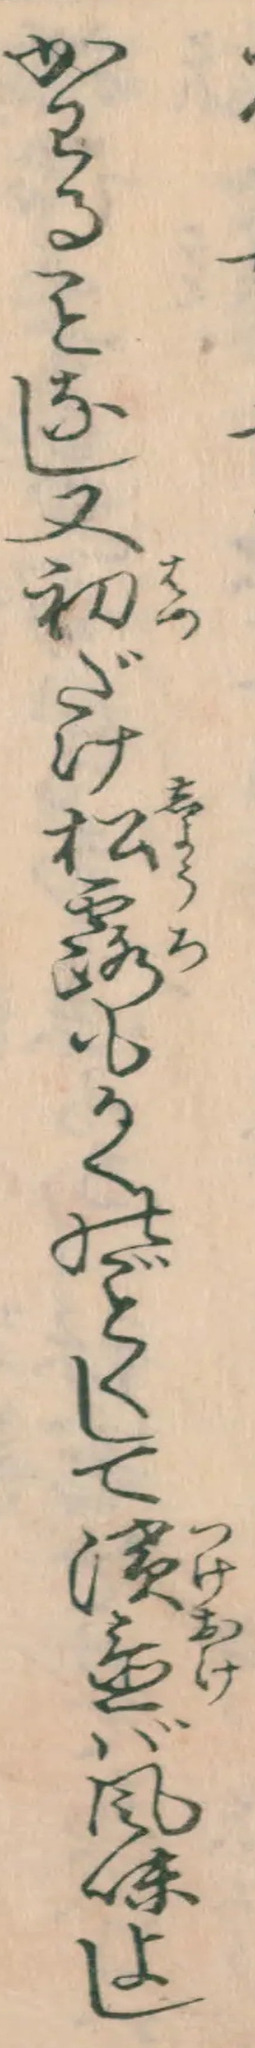かわることなし又初だけ松露もかくのごとくして漬置ば風味よし
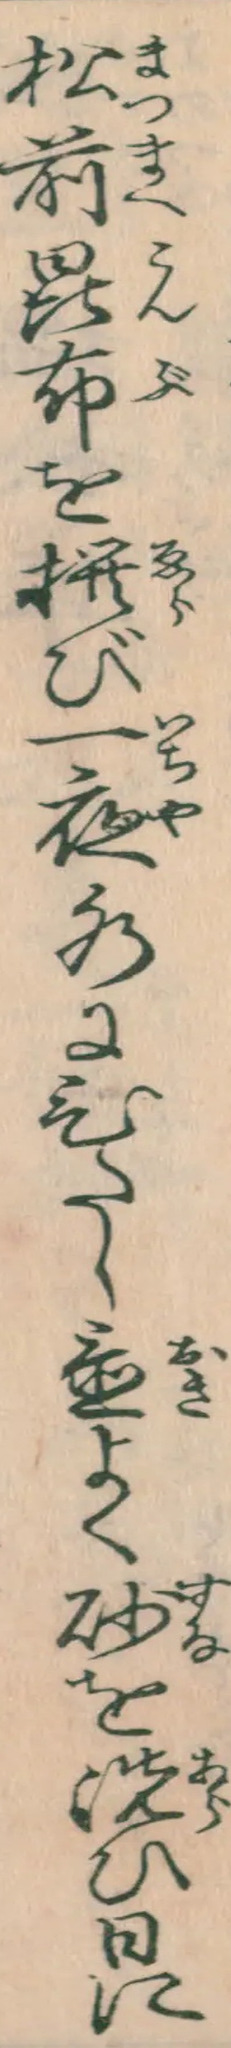松前昆布を撰び一夜水にひたし置よく砂を洗ひ日に
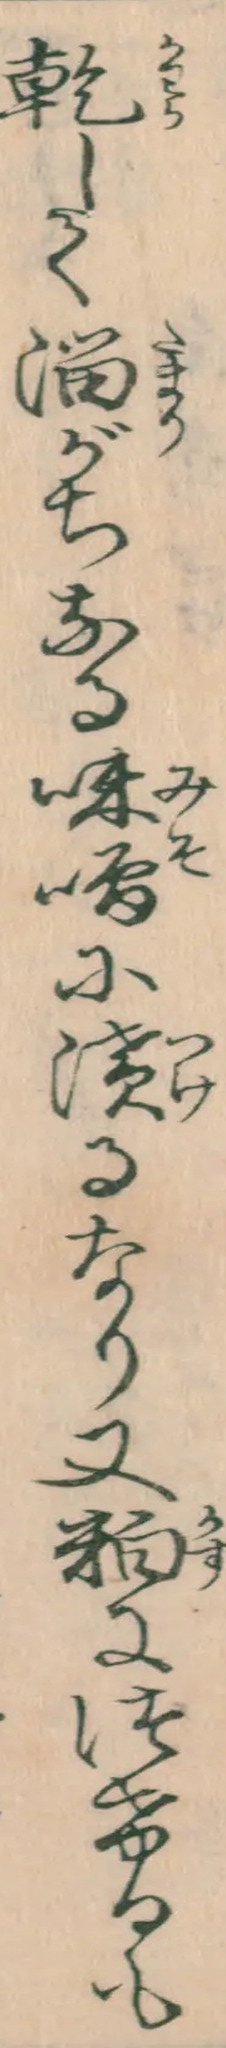乾して溜がちなる味噌に漬るなり又粕につけるも
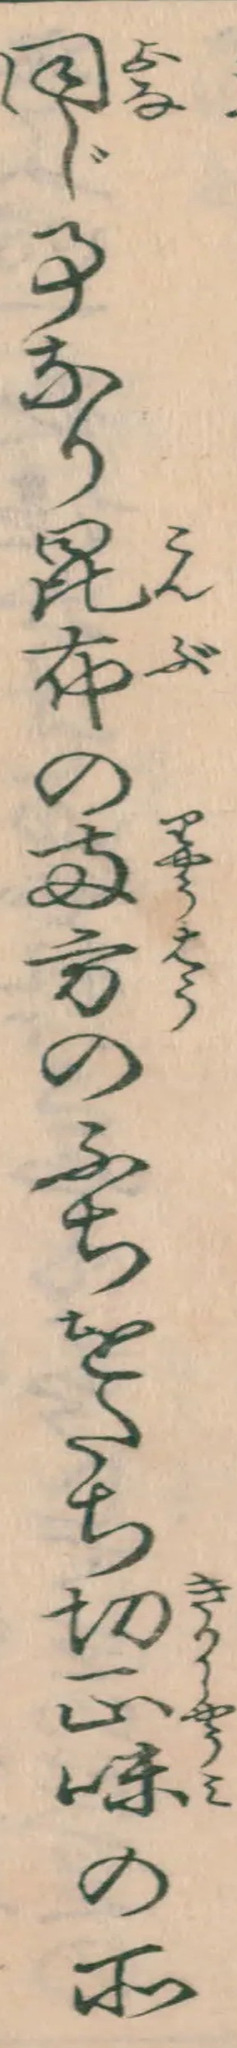同じ事なり昆布の両方のふちをたち切正味の所
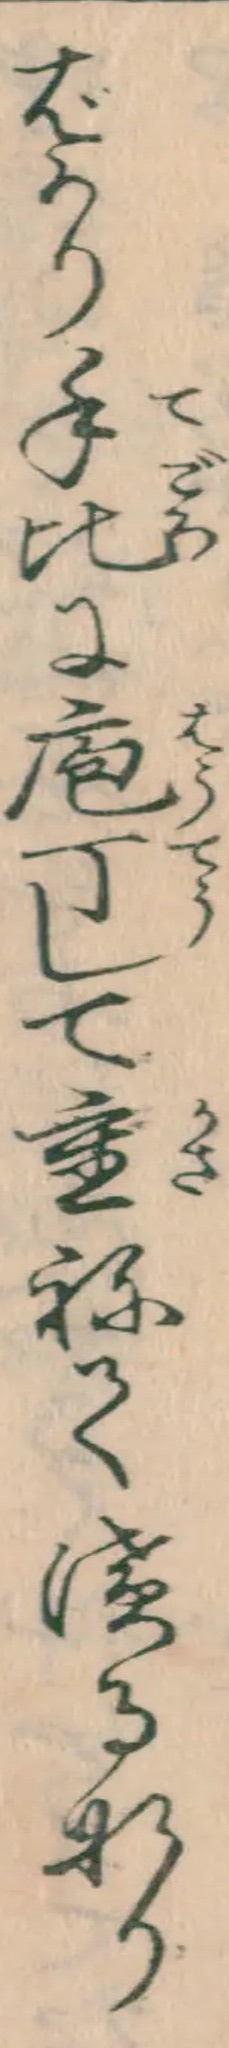ばかり手比に庖丁して重ねて漬るなり
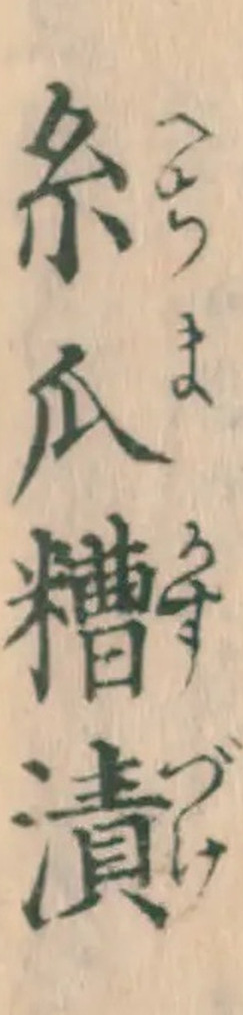糸瓜糟漬
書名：四季漬物鹽嘉言
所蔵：国立国会図書館 National Diet Library, JAPAN
